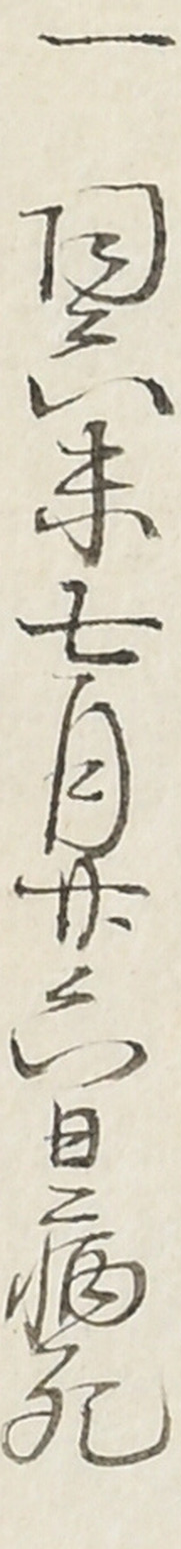一同六未七月廿六日病死
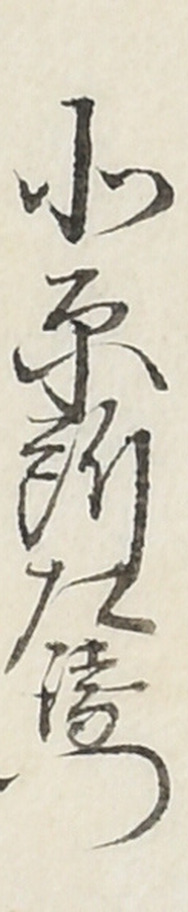北原所左衛門
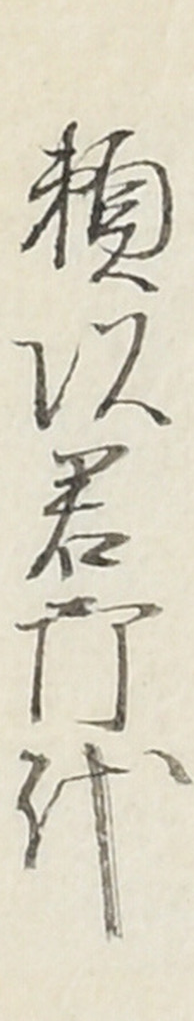頼以君御代
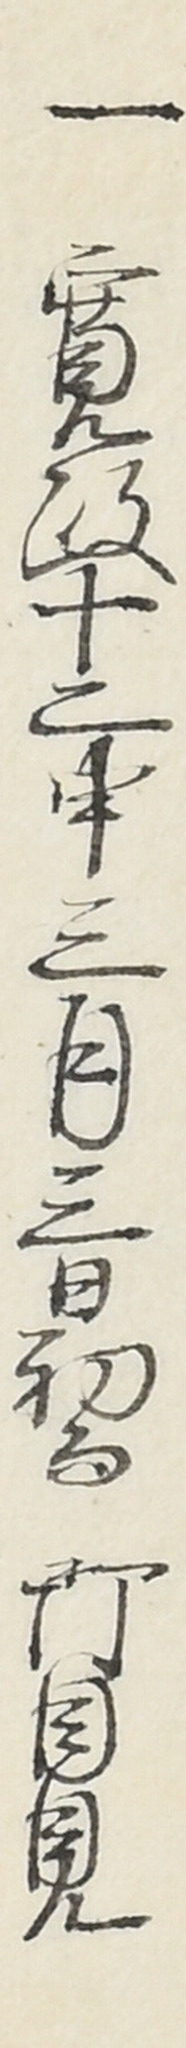一寛政十二申三月三日初而御目見
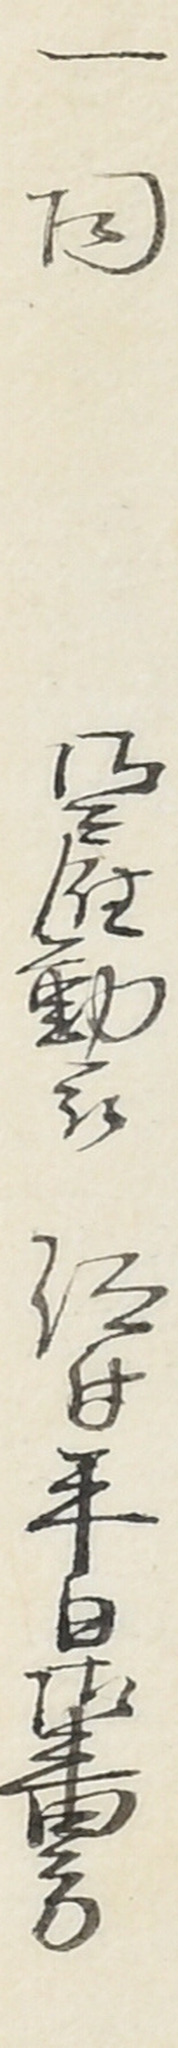一同御雇勤被仰付平日御番方
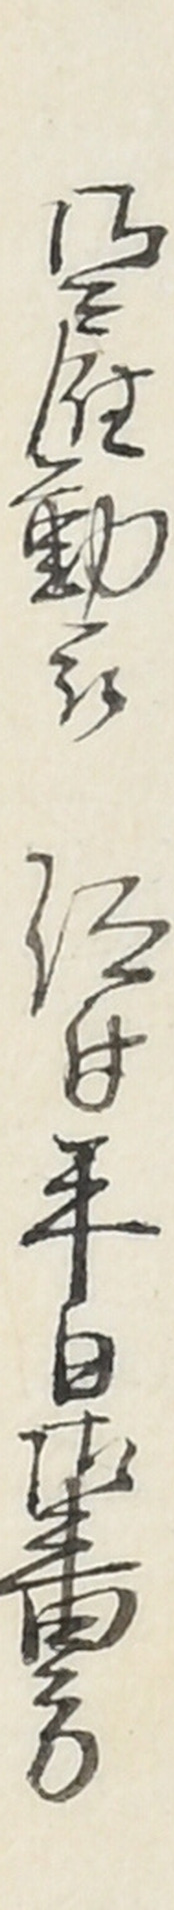一同御雇勤被仰付平日御番方

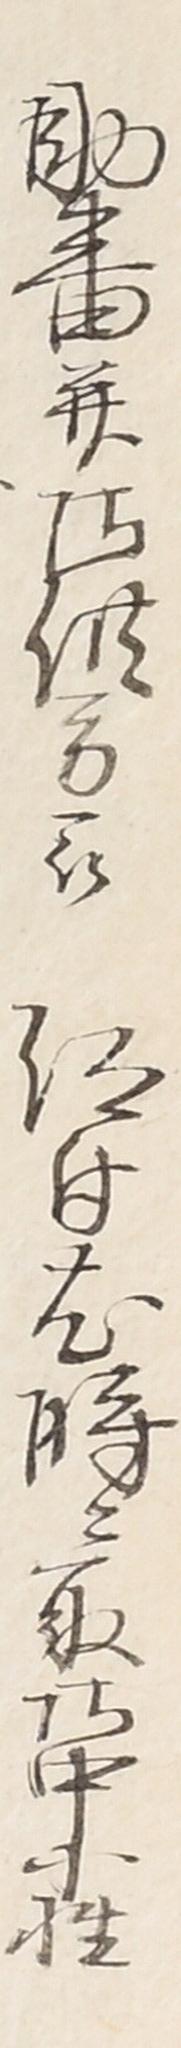助番幷御供方被仰付尤時ニ取御中小性
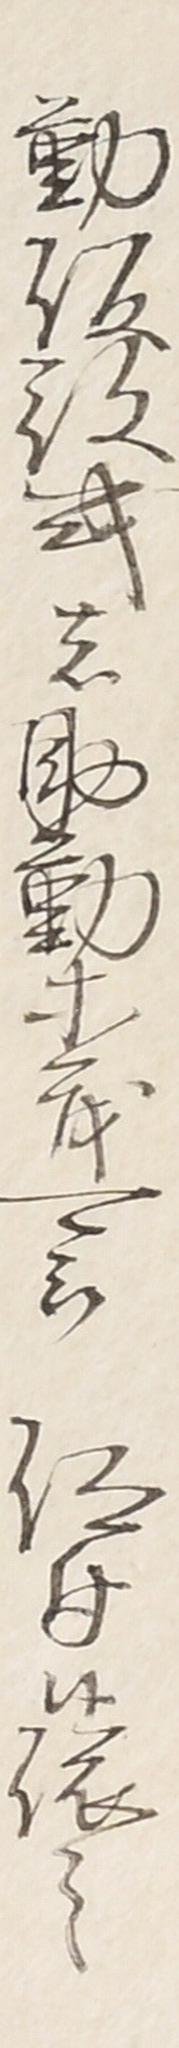勤仮跡式は助勤等も可被仰付候依之
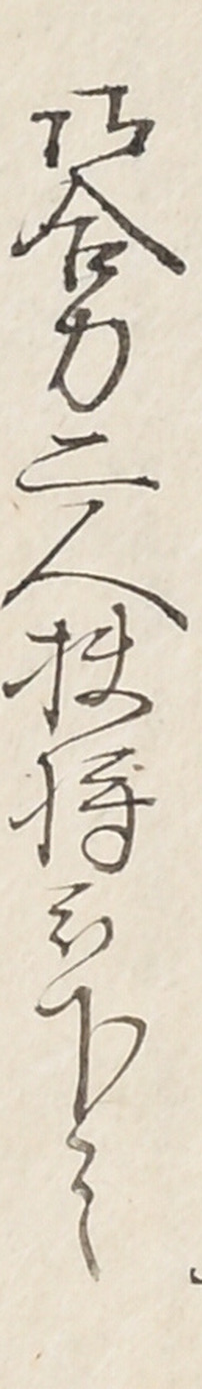御合力二人扶持被下之
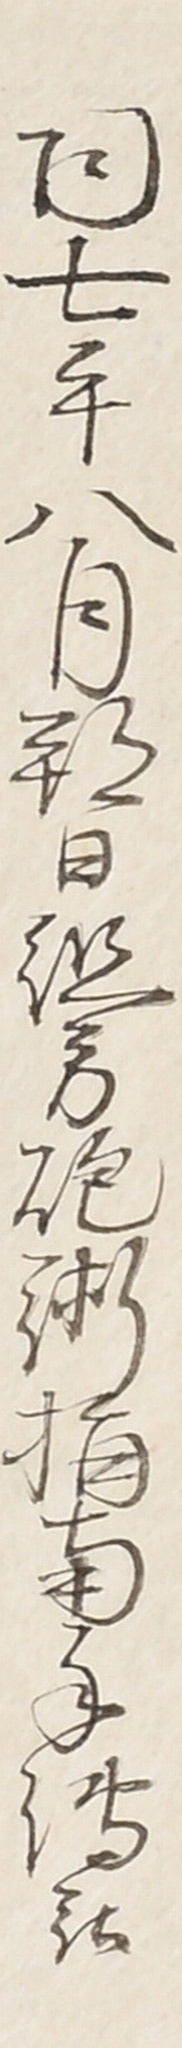一同七午八月朔日組方炮術指南手伝被
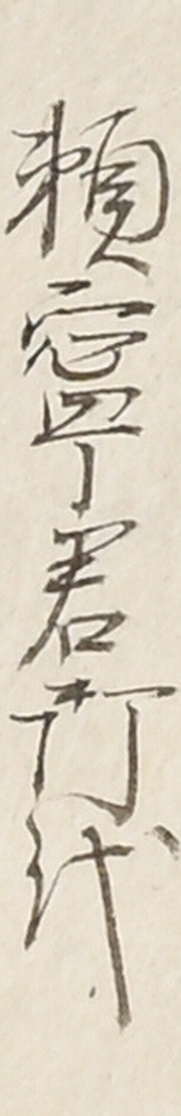頼寧君御代
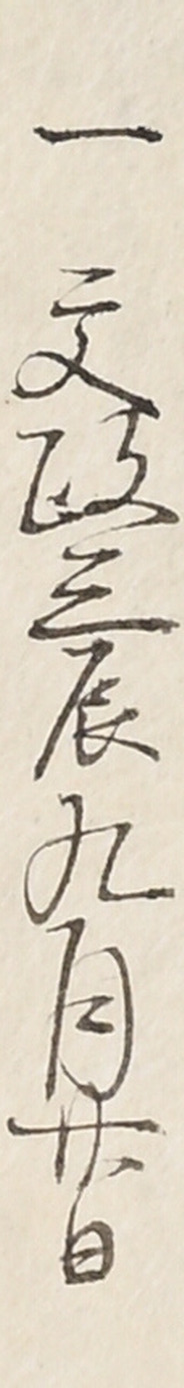一文政三辰九月廿日
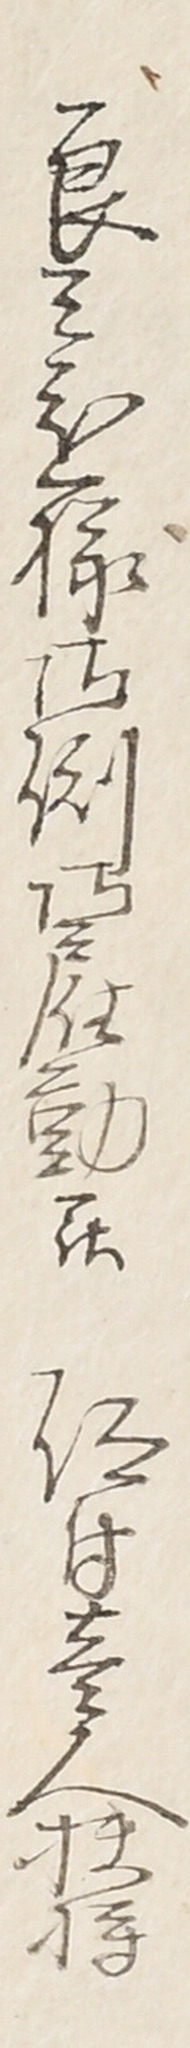良之進様御側御雇勤被仰付壱人扶持
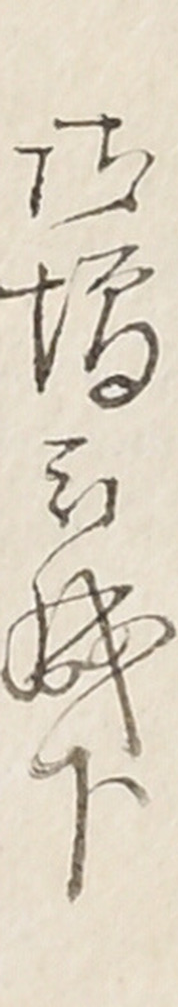御増被成下
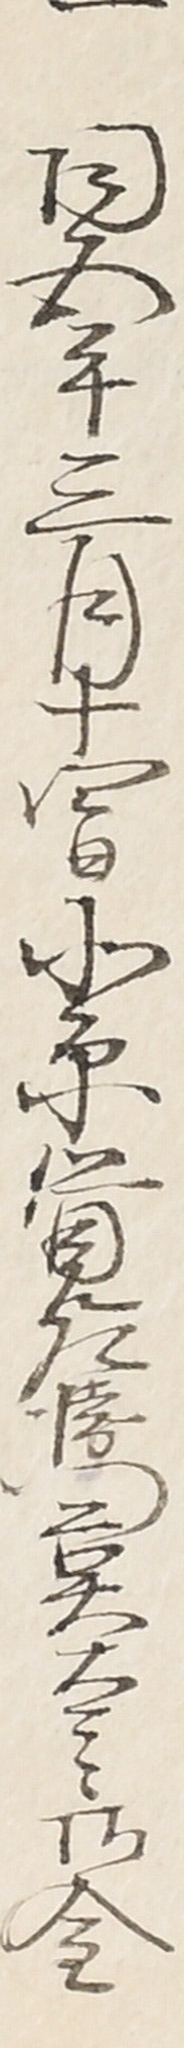一同五午三月十四日北原覚左衛門莫太之御金
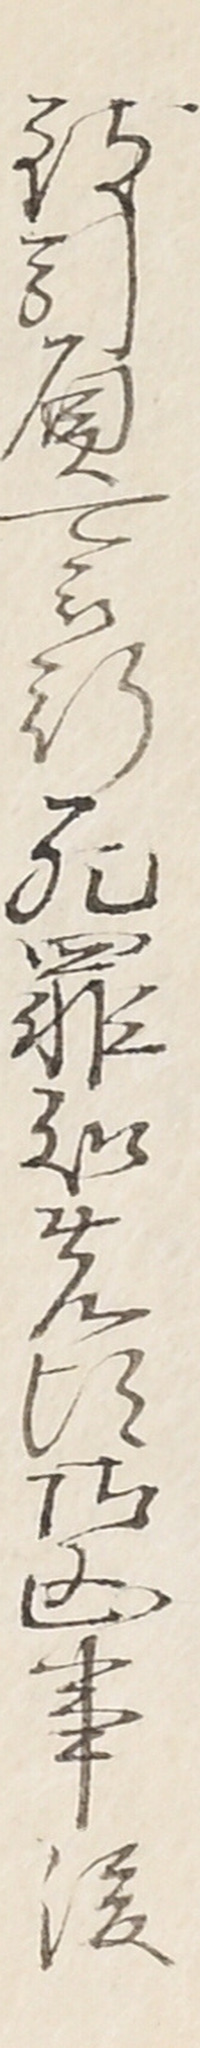致引負可被行死罪処先頃御凶事後
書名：給人諸士勤仕録（七）
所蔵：伊那市立高遠町図書館・合同会社AMANE
